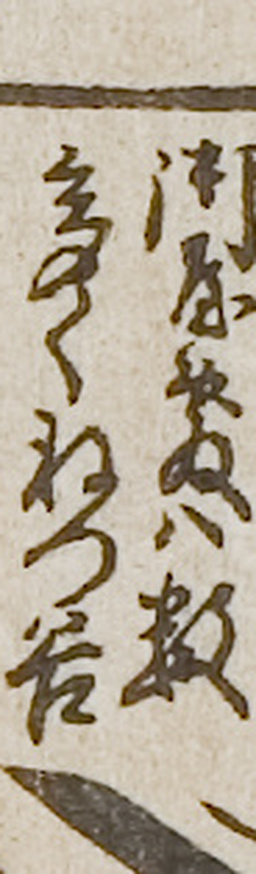多くねつ谷
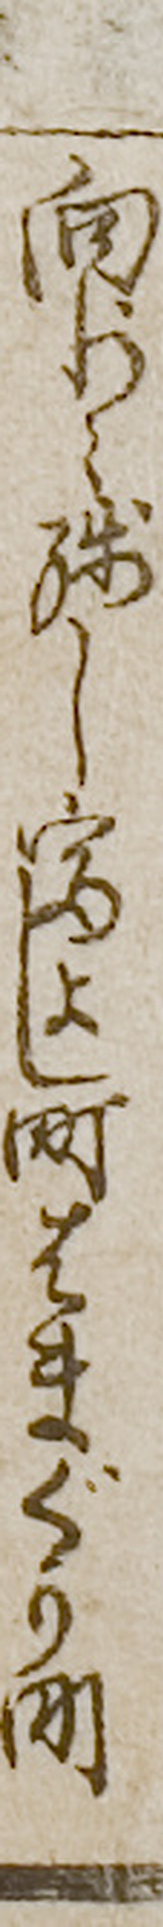向少々残し富よし町はまぐり町
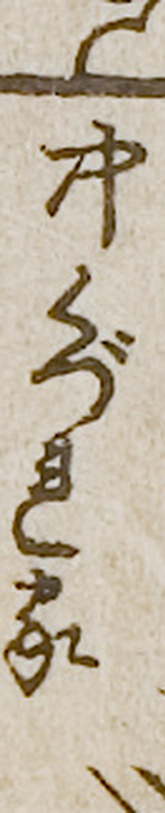中くづれ家
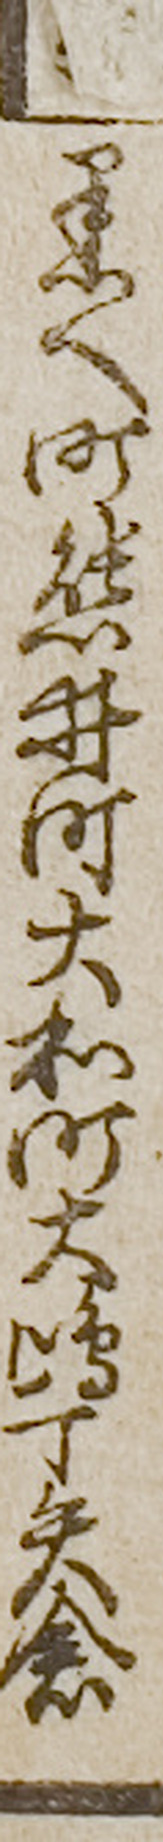黒へ町熊井町大和町大嶋丁矢倉
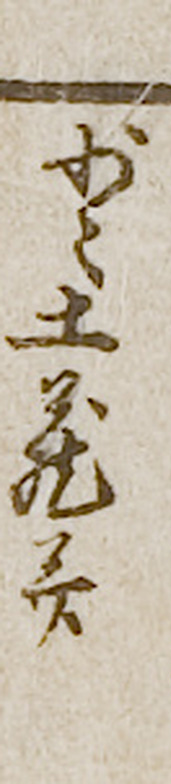少々土蔵并
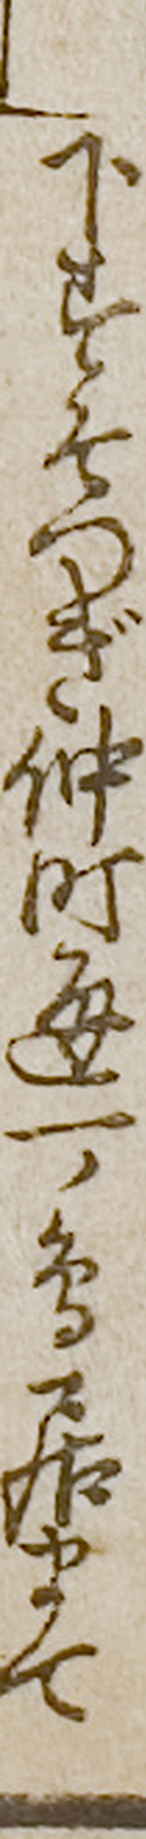下すそつぎ仲町通一ノ鳥居まて
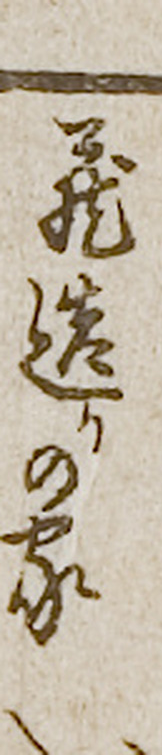蔵造りの家
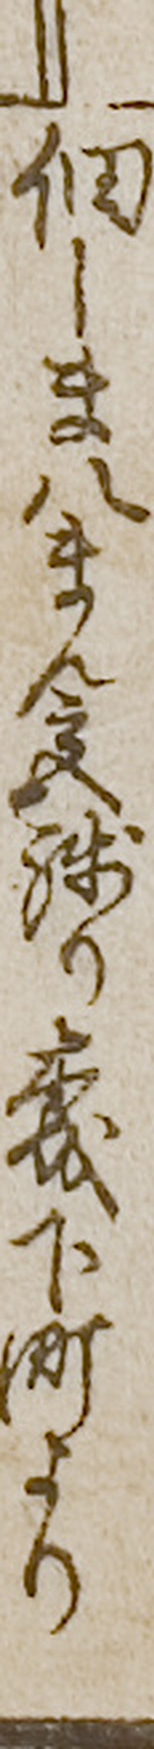佃しま八まん宮残り森下町より
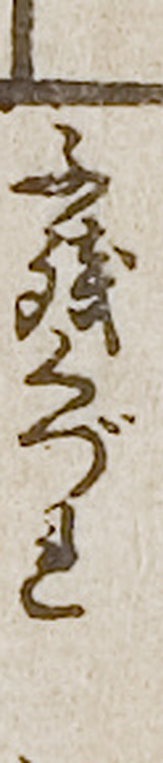不残くづれ
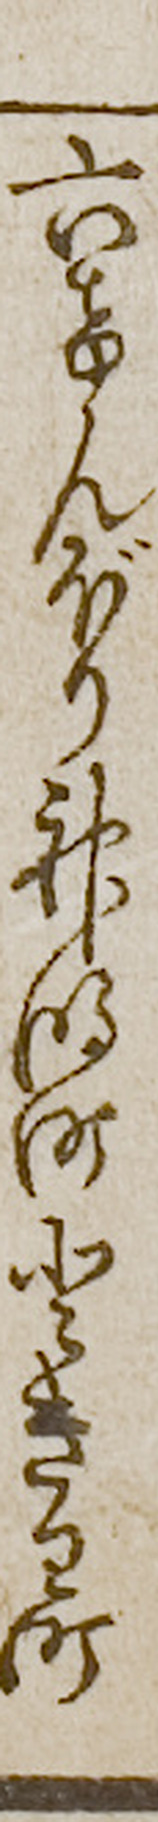六けんぼり神明町ときわ町
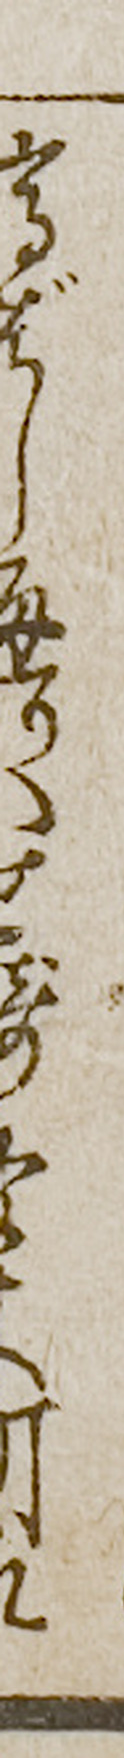高ばし通りいせ崎冬木町凡
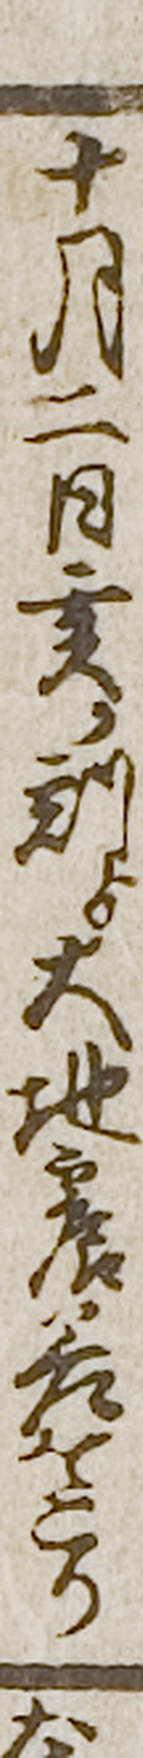十月二日亥の刻ゟ大地震差をこり
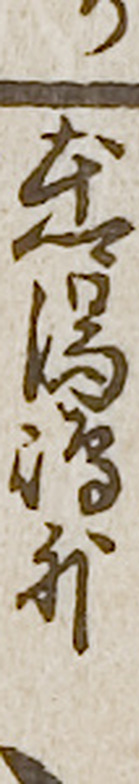本郷湯嶋外
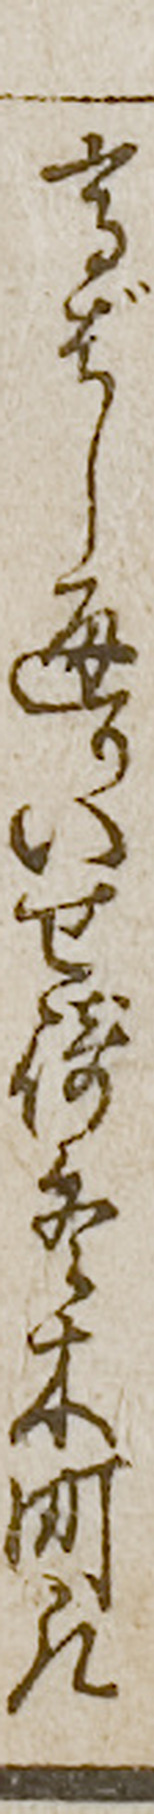高ばし通りいせ崎冬木町凡
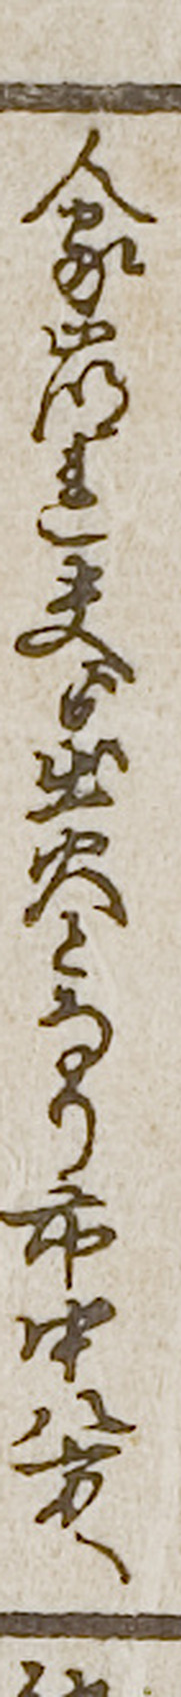人家崩れ夫ゟ出火となり市中八方へ
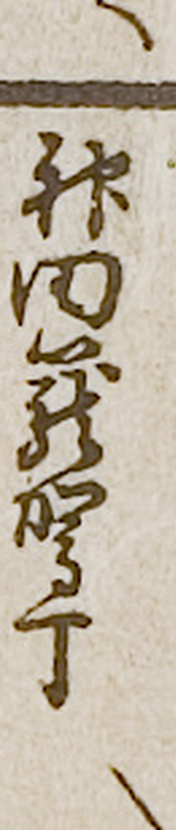神田籠駕丁
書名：東都珍事実録咄
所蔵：東京大学総合図書館 General Library in the University of Tokyo, JAPAN
